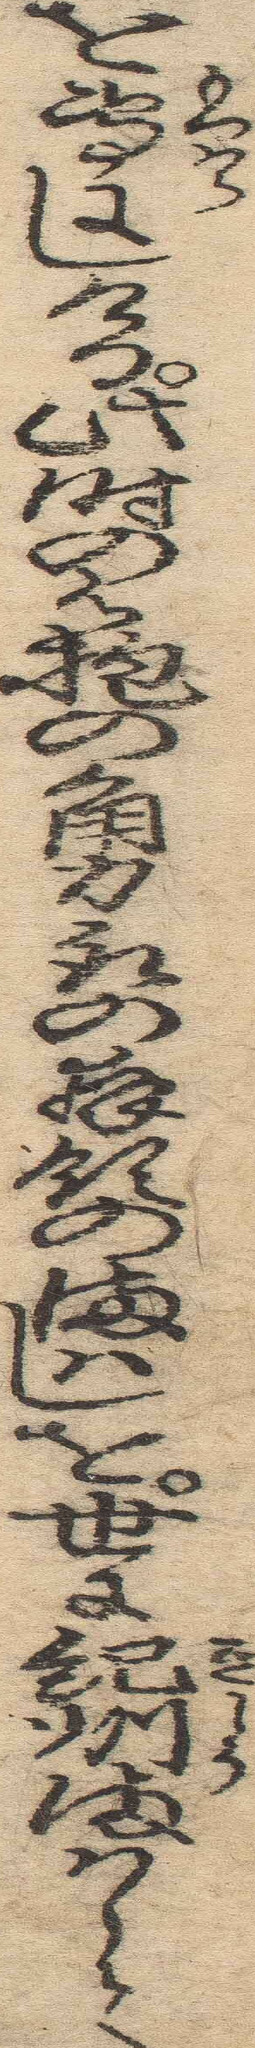を専にしける。此時の御抱の角力取の拝領のまはしを。世に紀州まはしと
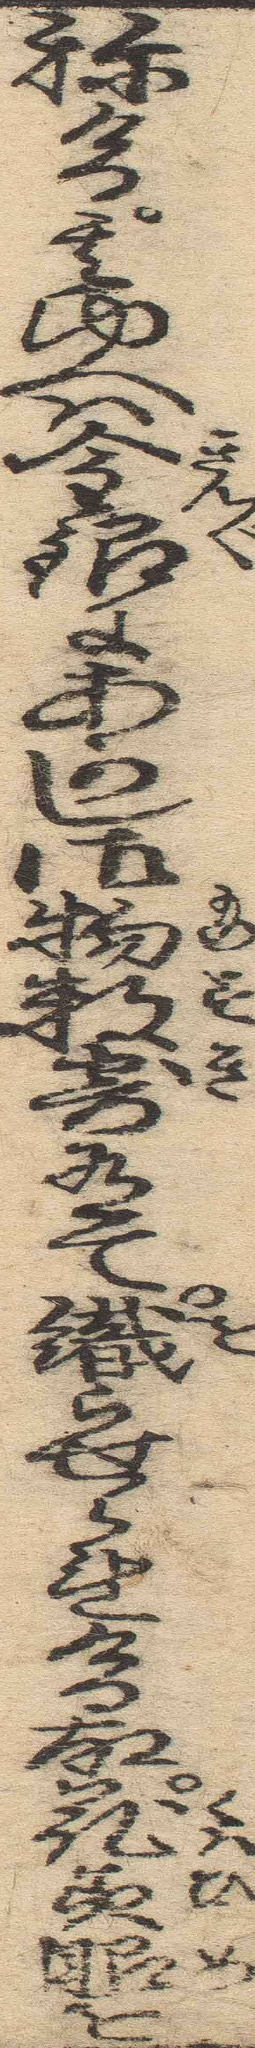称ける。其ゆへは金銀にあかし御物数寄有て。織らせられける故。花美眼を
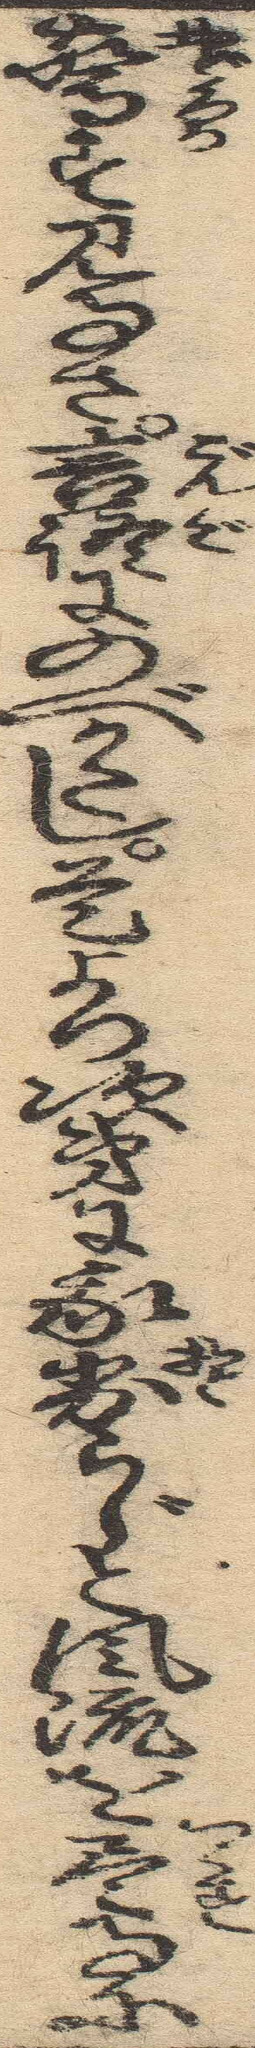驚す見事さ。言語にのべかたし。是より次第に我劣らじと風流を尽るに
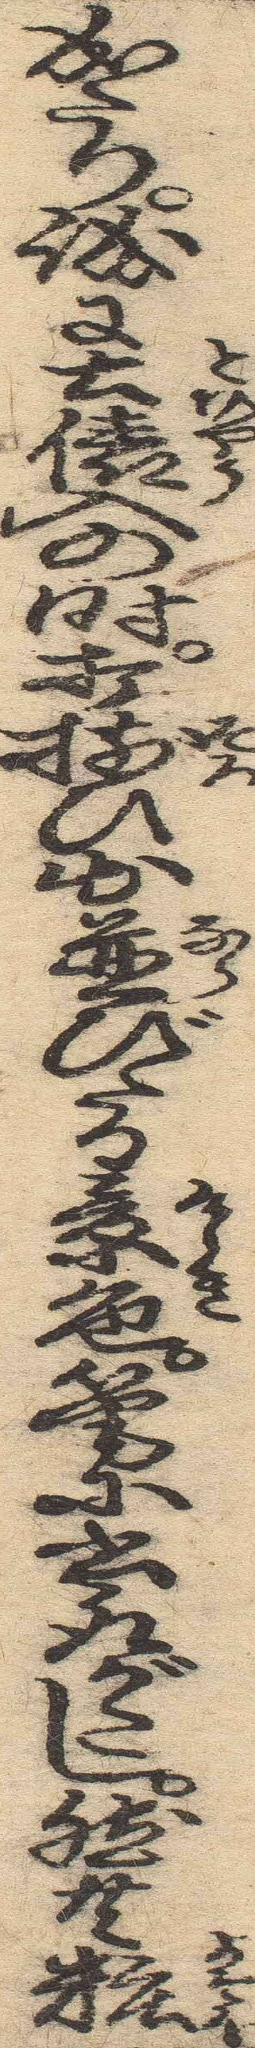成たり。誠に土俵入の時。打揃ひ出並びたる景色。筆に書取がたし。然共粧
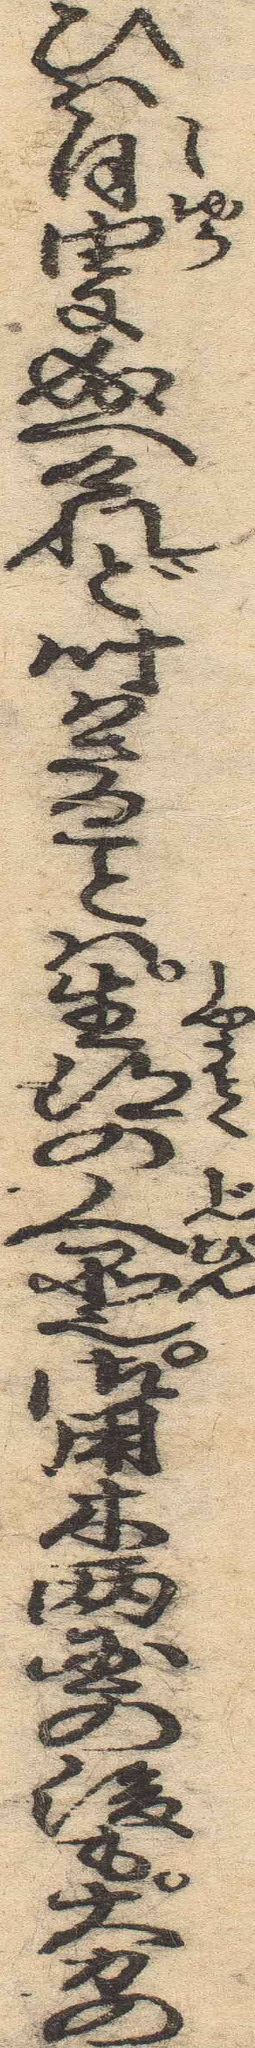ひは自由に成へけれど叶はさることは。生得の人品也。御用木両国の後も。大力の
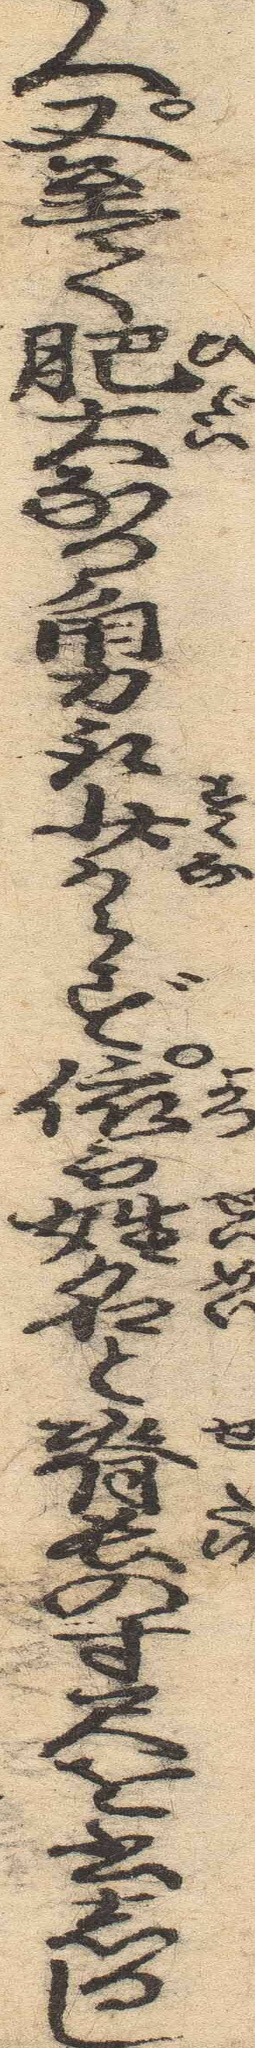人。又至て肥大なる角力取少からず。依而姓名と背長の寸尺を書しるし
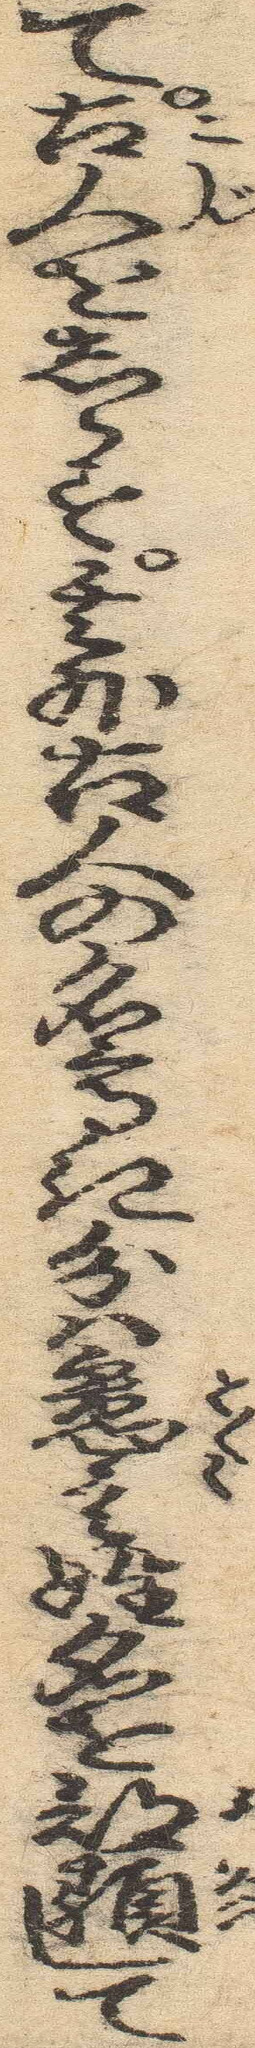て。古人をしらす。其外古人の名号記分は悉其姓名を部類して
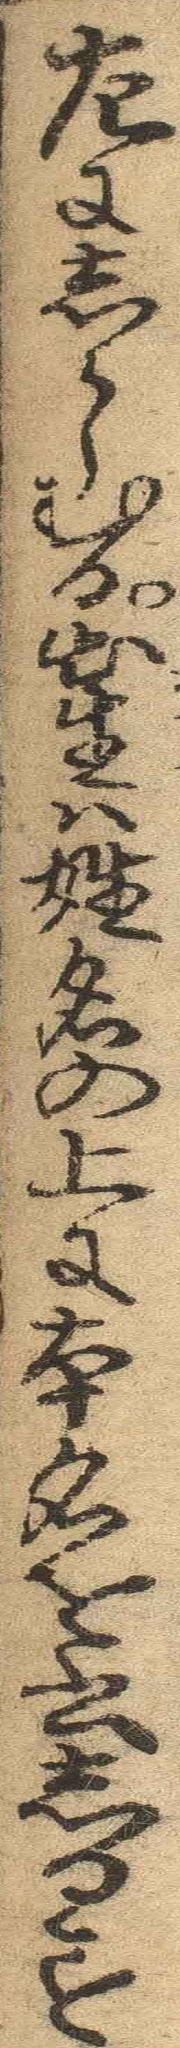左にしらしむる。出生は姓名の上に本名を書しるす
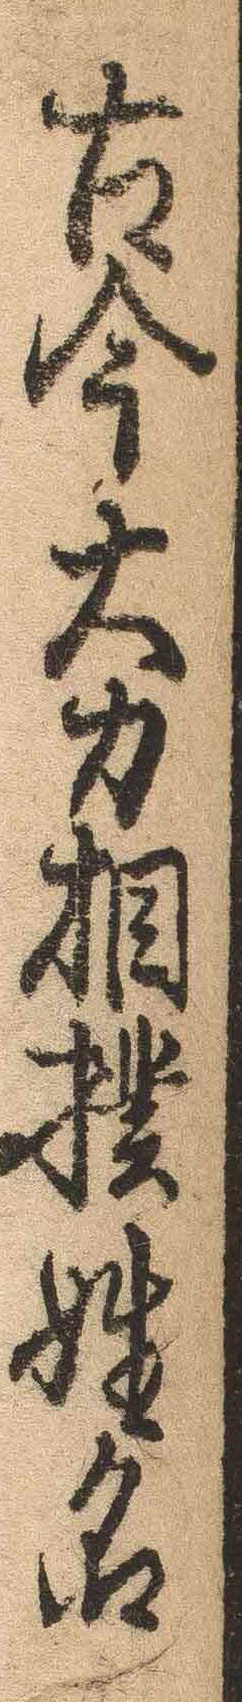古今大力相撲姓名
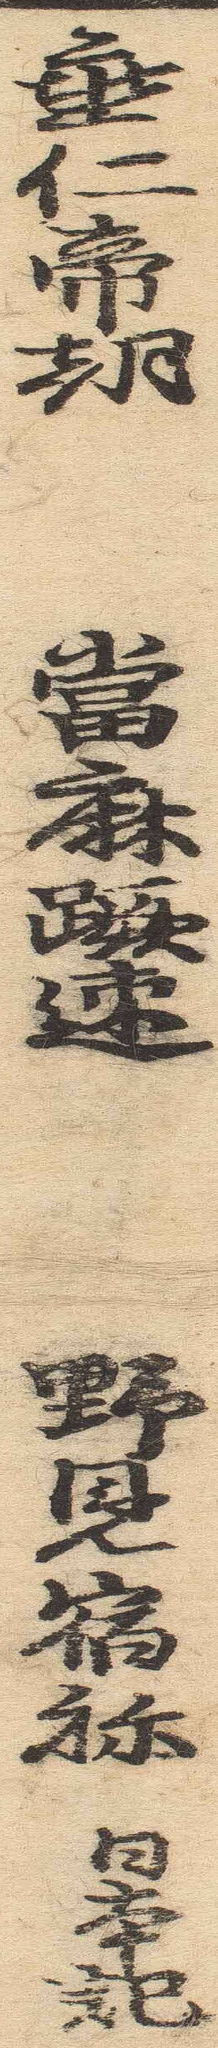垂仁帝朝当麻蹴速野見宿禰日本記
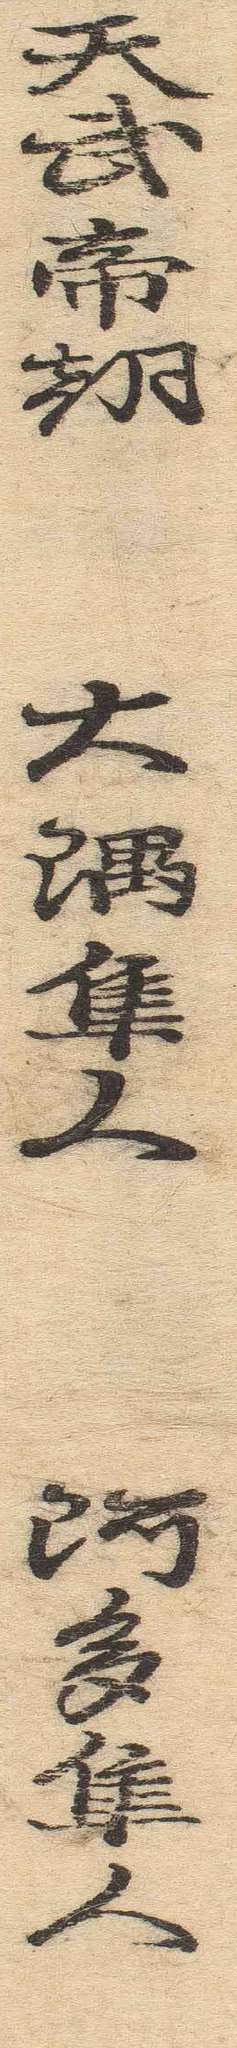天武帝朝大隅隼人阿多隼人

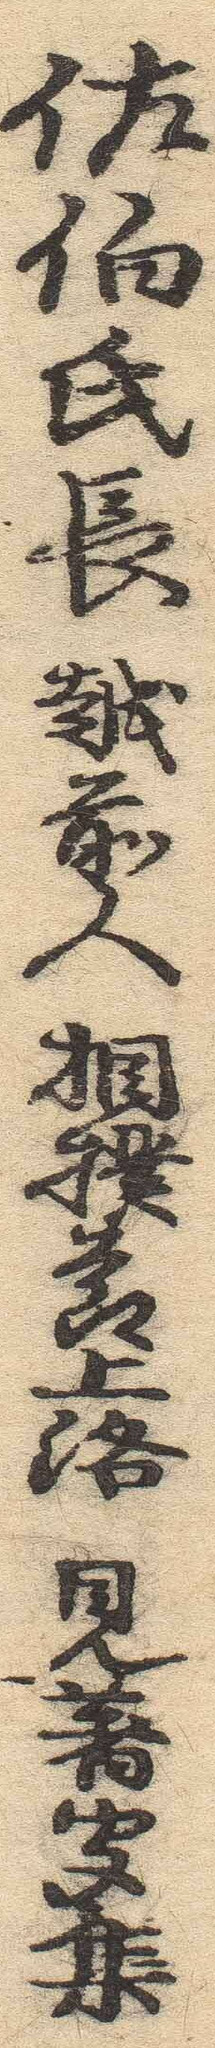佐伯氏長越前人相撲節上洛見著聞集
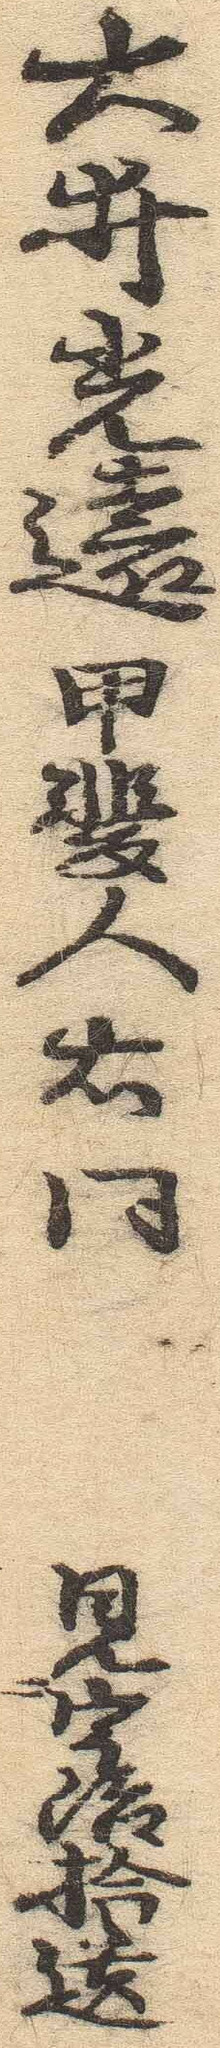大井光遠甲斐人右同見宇治拾遺
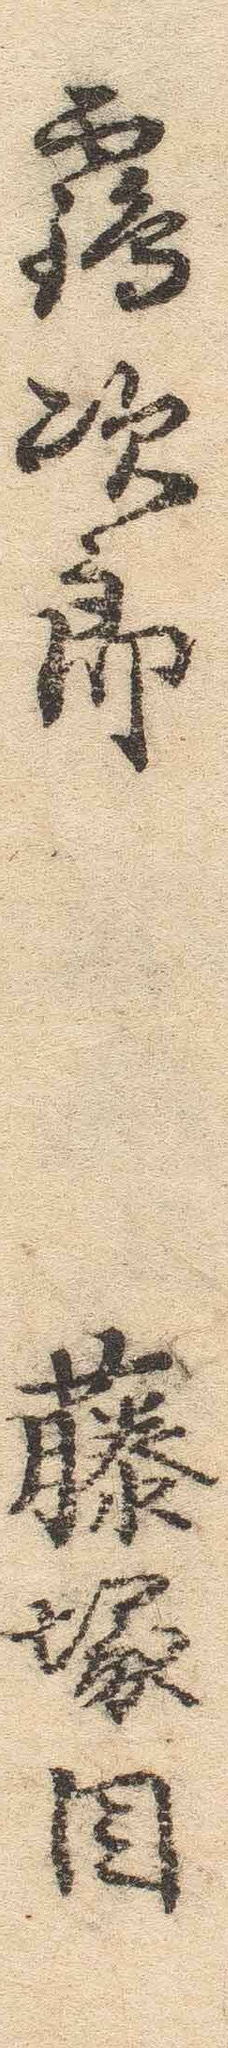鶴次郎藤塚目
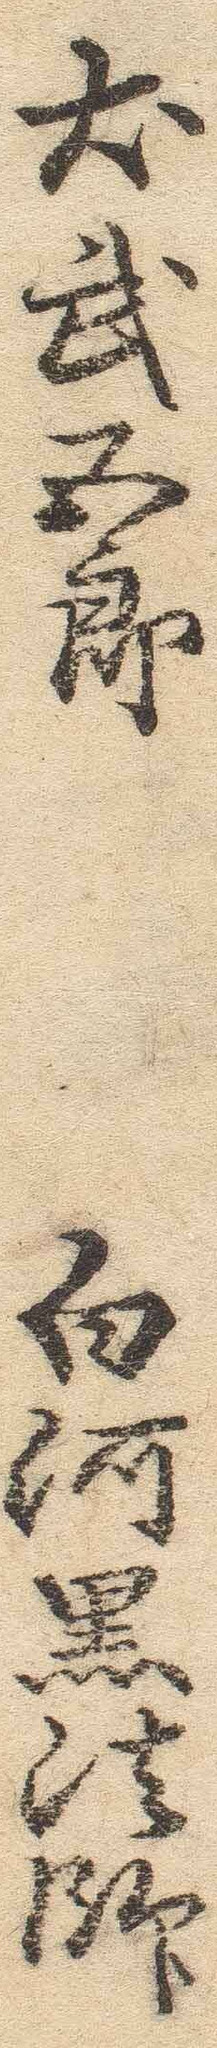大武五郎白河黒法師
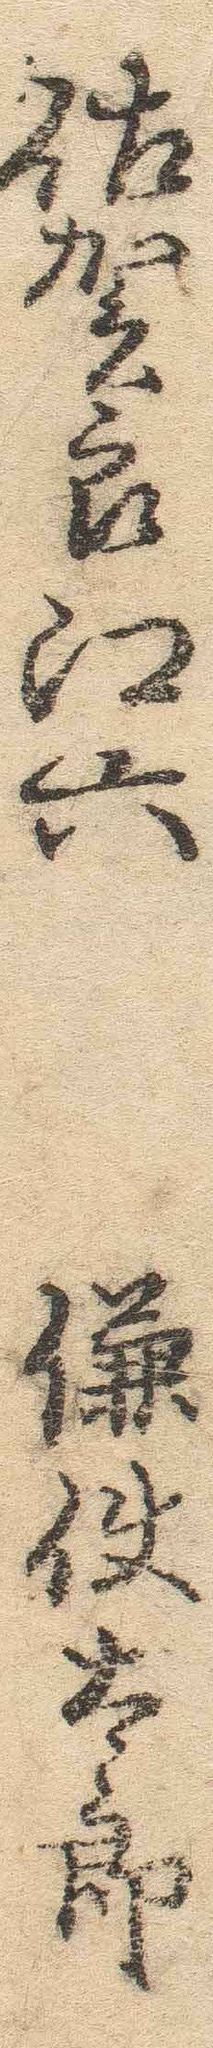佐賀良江六傔仗太郎
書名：古今相撲大全
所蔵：東京学芸大学附属図書館 国文学研究資料館
